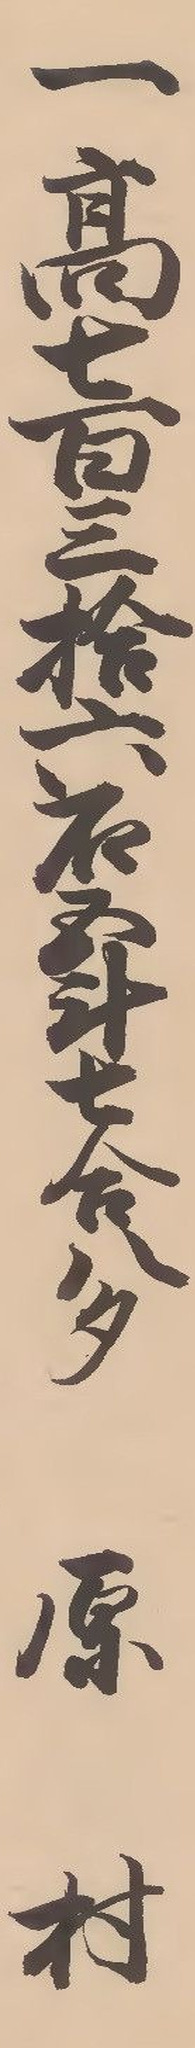一高七百三拾六石五斗七合八勺原村
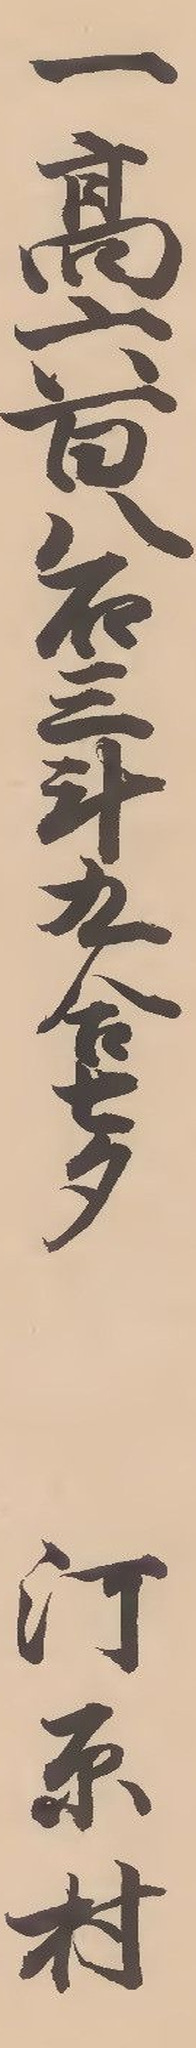一高六百八石三斗九合七勺河原村
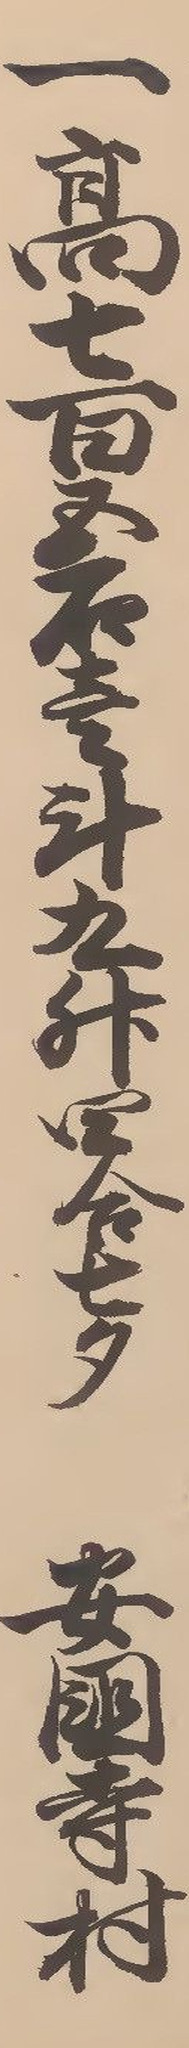一高七百五石壱斗九升四合七勺安国寺村
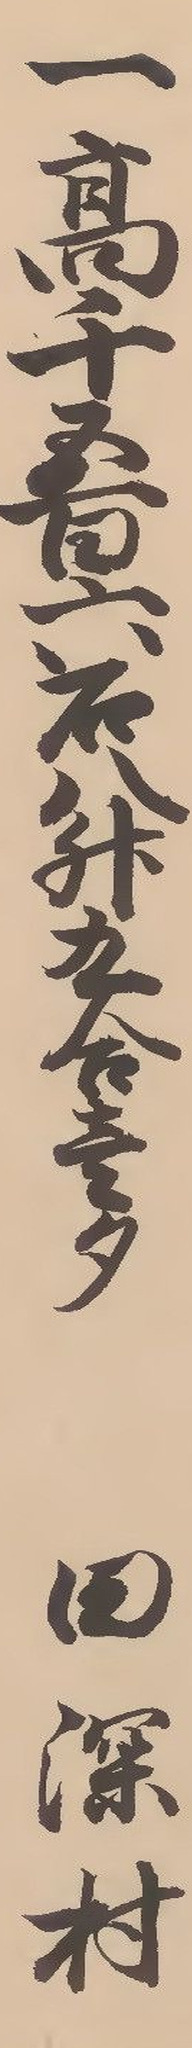一高千五百六石八升九合壱勺田深村
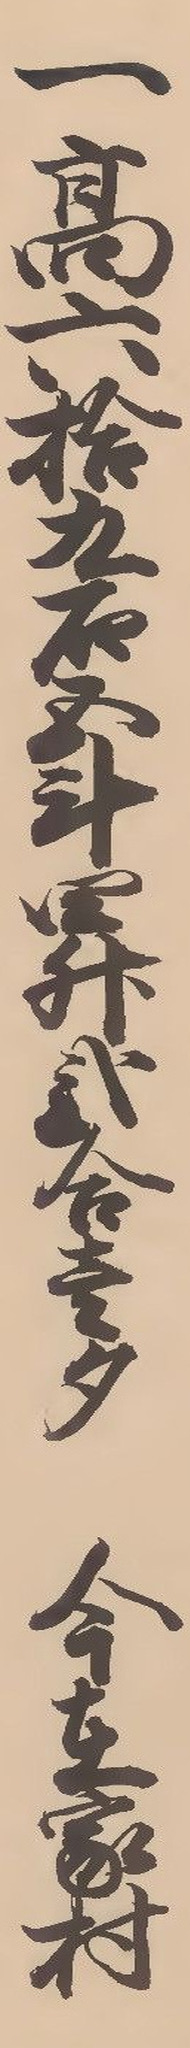一高六拾九石五斗四升弐合壱勺今在家村
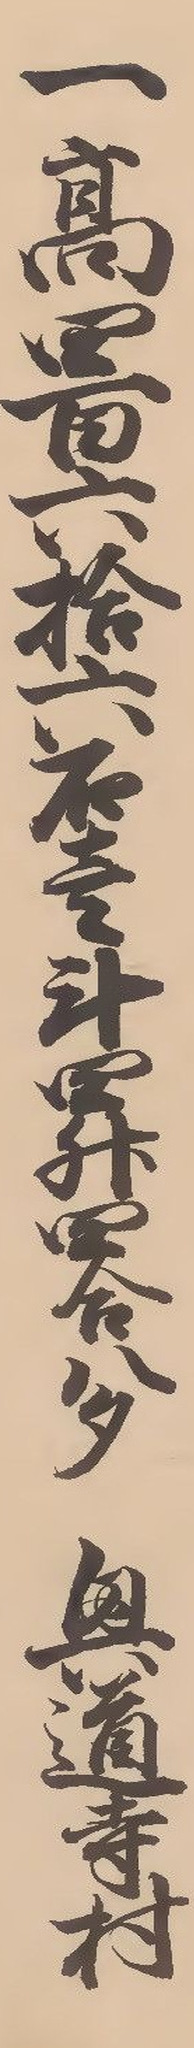一高四百六拾六石壱斗四升四合八勺興道寺村

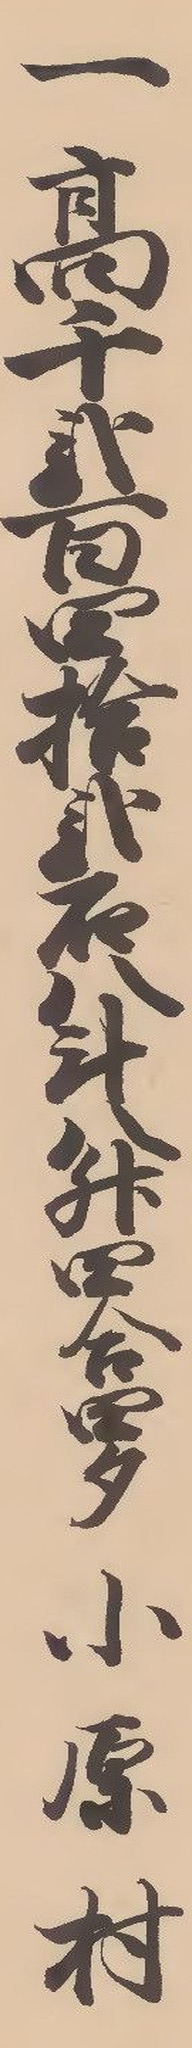一高千弐百四拾弐石八斗八升四合四勺小原村
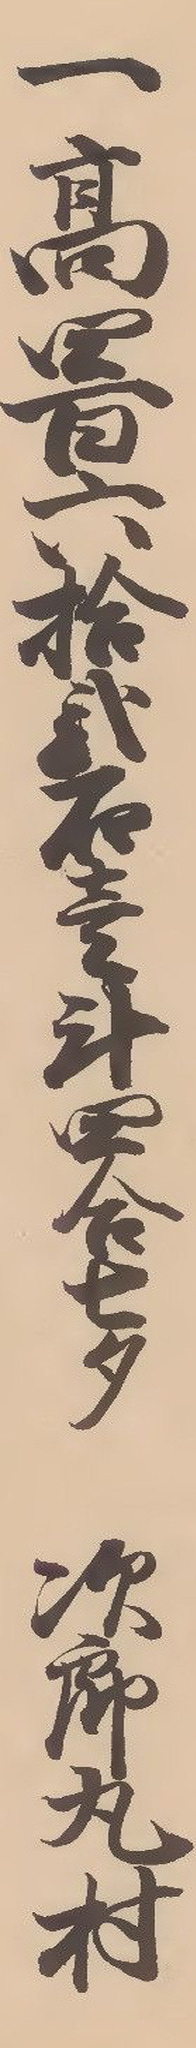一高四百六拾弐石壱斗四合七勺次郎丸村
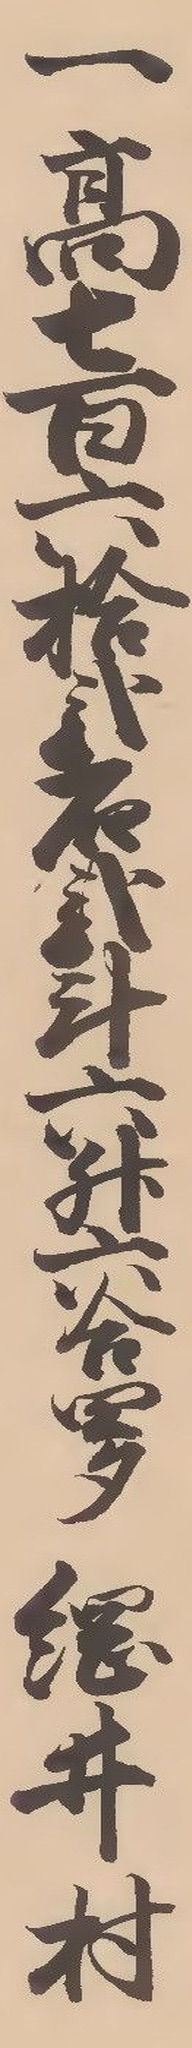一高七百六拾弐石弐斗六升六合四勺綱井村
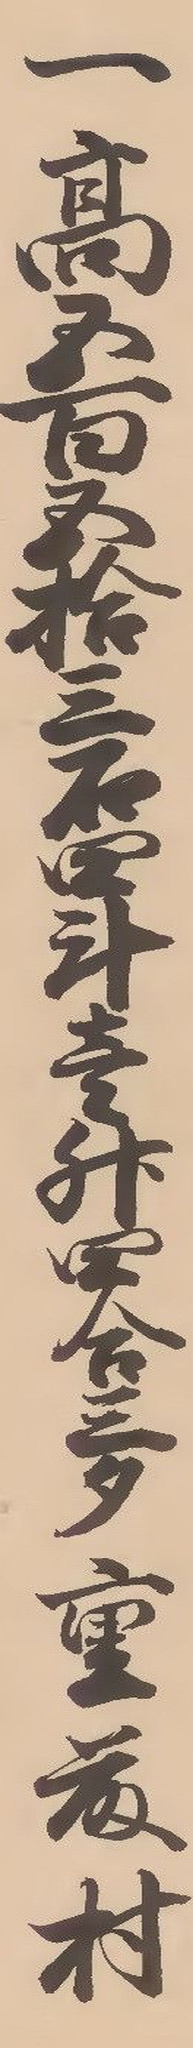一高五百五拾三石四斗壱升四合三勺重藤村
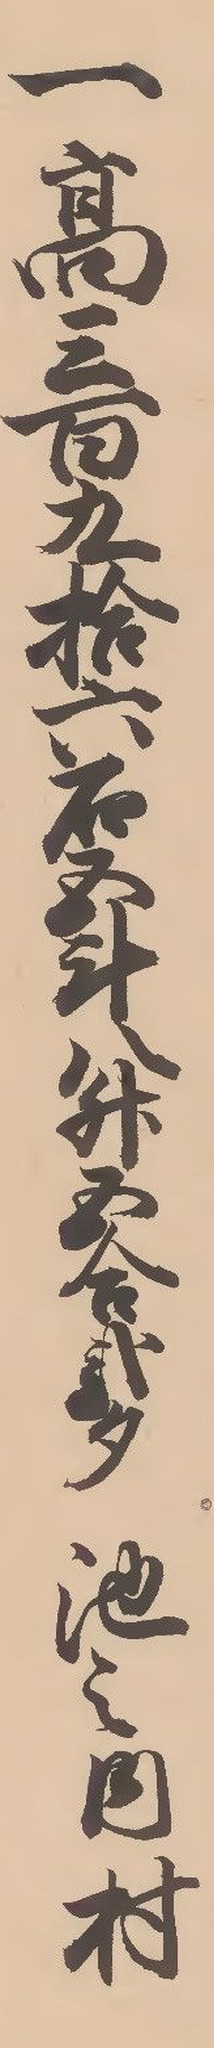一高三百九拾六石五斗八升五合弐勺池之内村
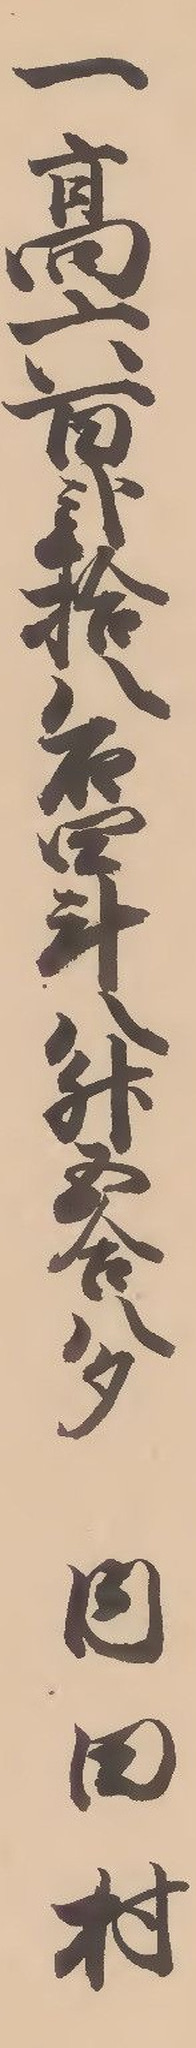一高六百弐拾八石四斗八升五合八勺内田村
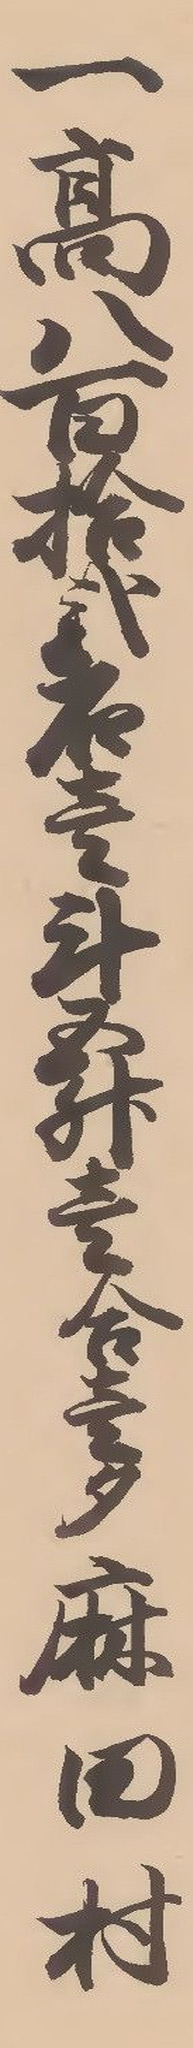一高八百拾弐石壱斗五升壱合壱勺麻田村
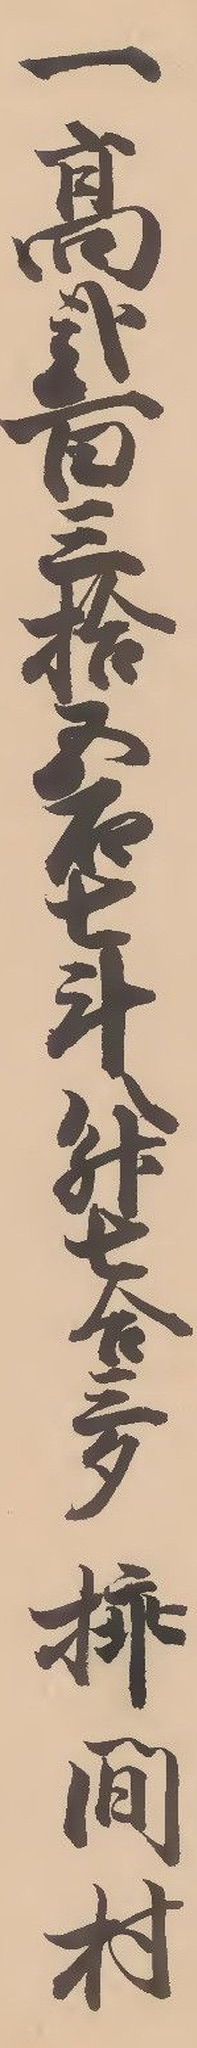一高弐百三拾五石七斗八升七合三勺挟間村

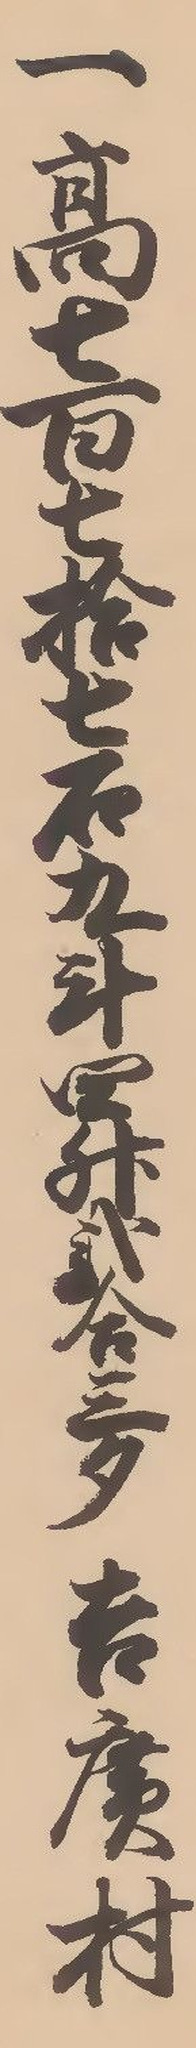一高七百七拾七石九斗四升弐合三勺吉広村
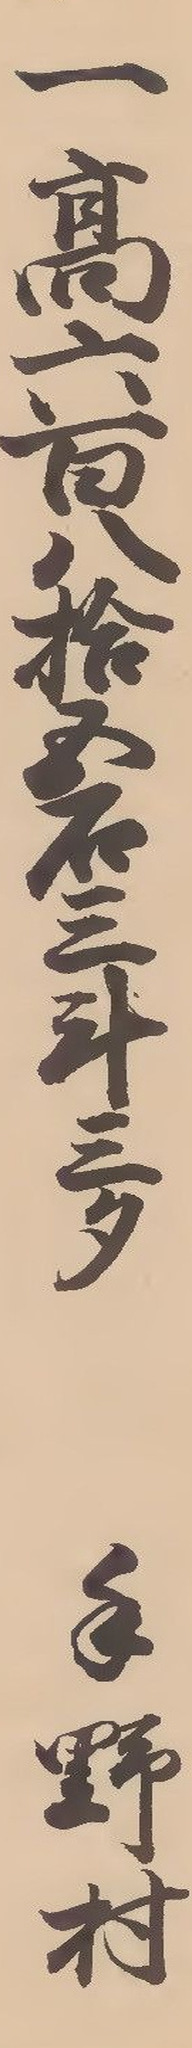一高六百八拾五石三斗三勺手野村
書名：豊後国郷帳
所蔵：国立公文書館 National Archives of Japan
